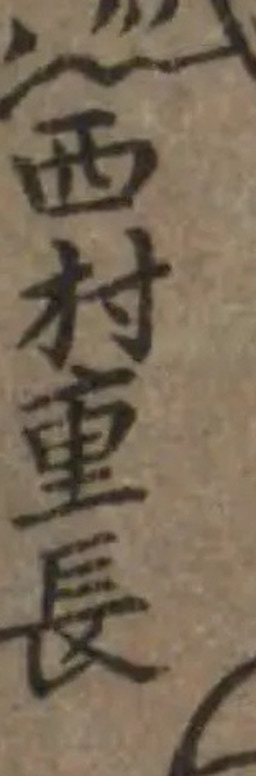西村重長

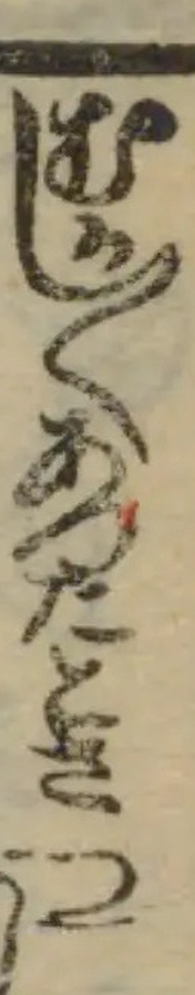むかし〳〵あつたとさ
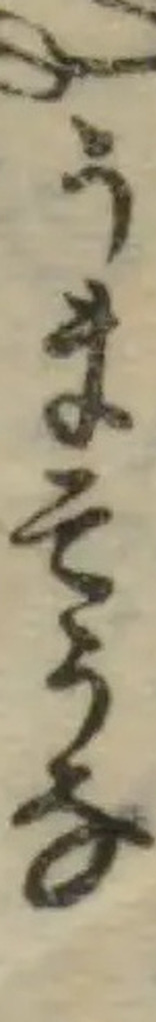うまそうな
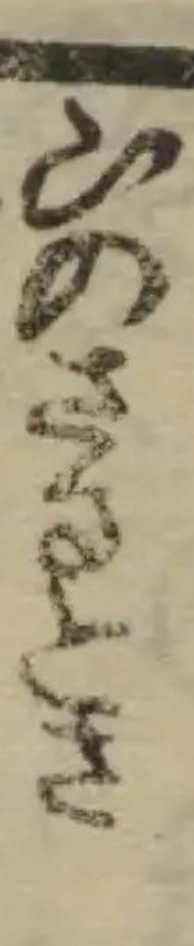山のさるとさ
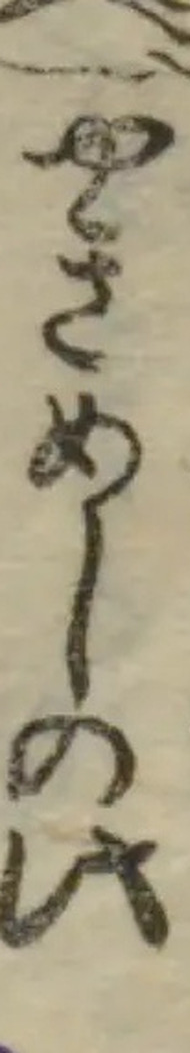やきめしの此
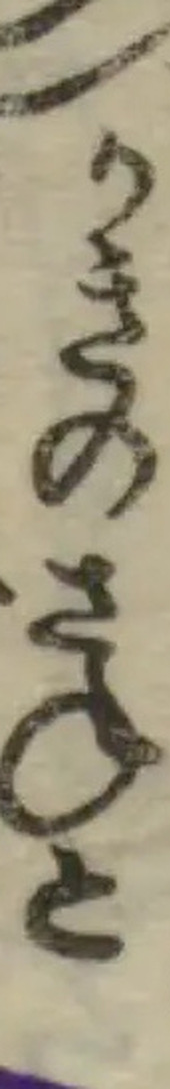かきのさねと
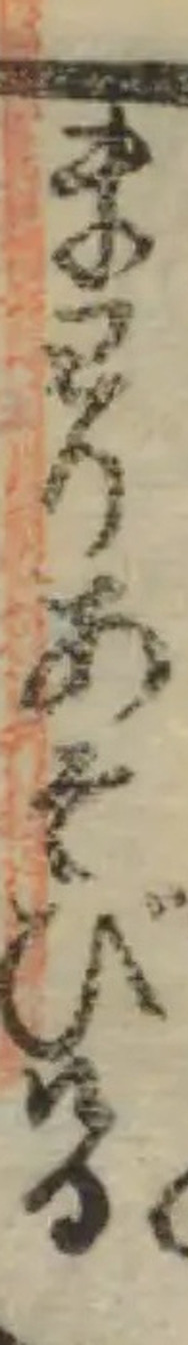まわりあそびける
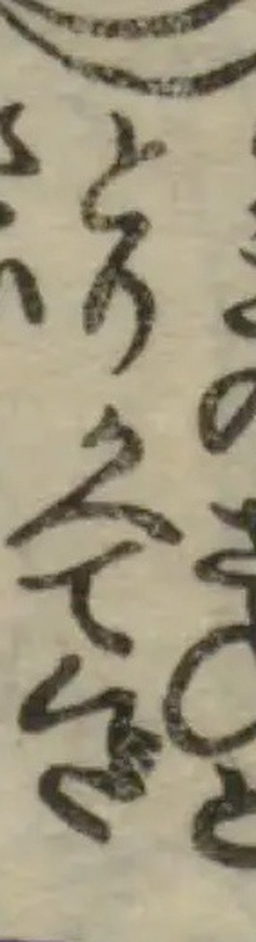とりかへてくだ
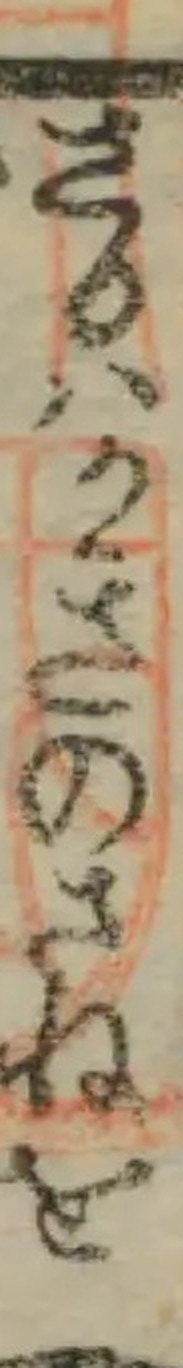さるはかきのたねを
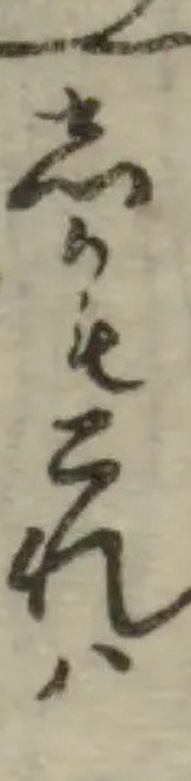しかもこれは
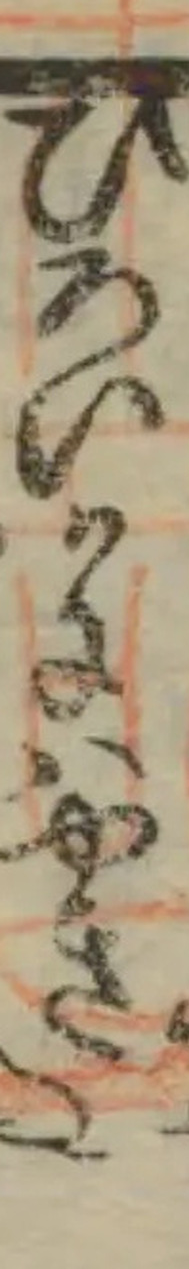ひろいかにはやき
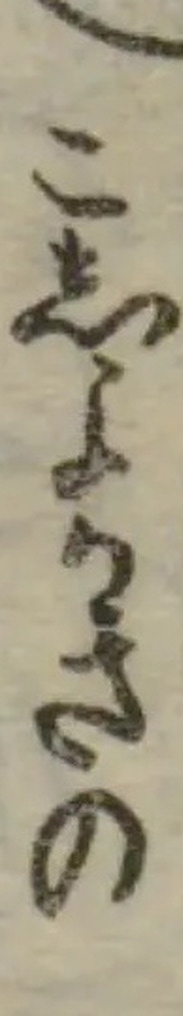こしよかきの
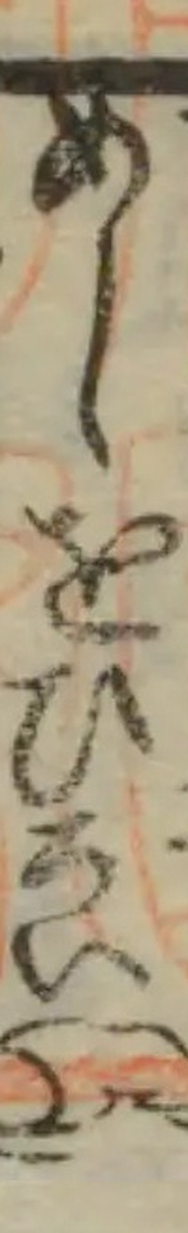めしをひろい
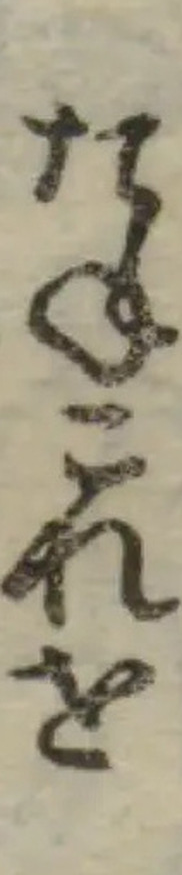たねこれを
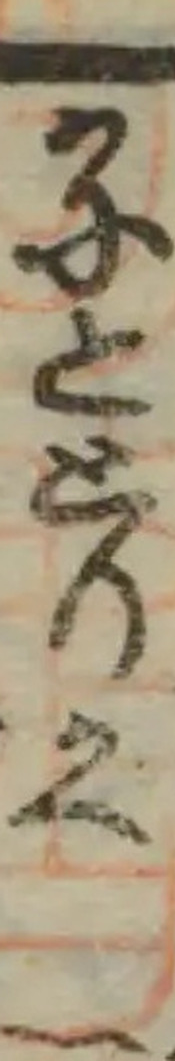かにととりかへ
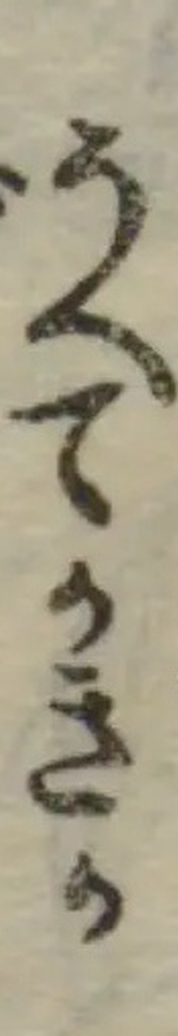うへてかきか
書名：さるかに合戦
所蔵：国立国会図書館 National Diet Library, JAPAN
